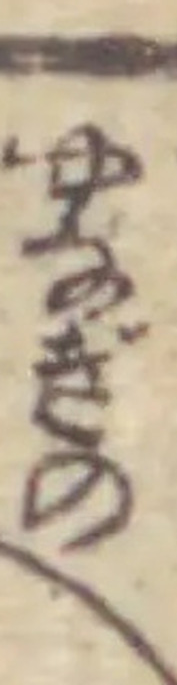やなぎの
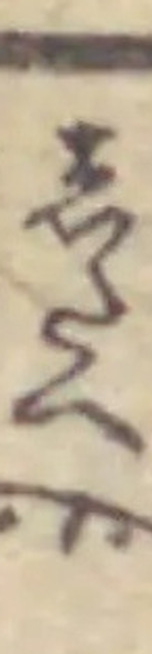したへ
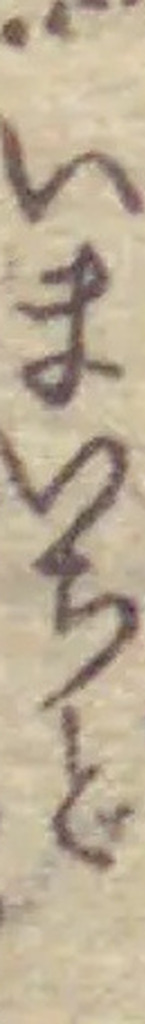いまいちど
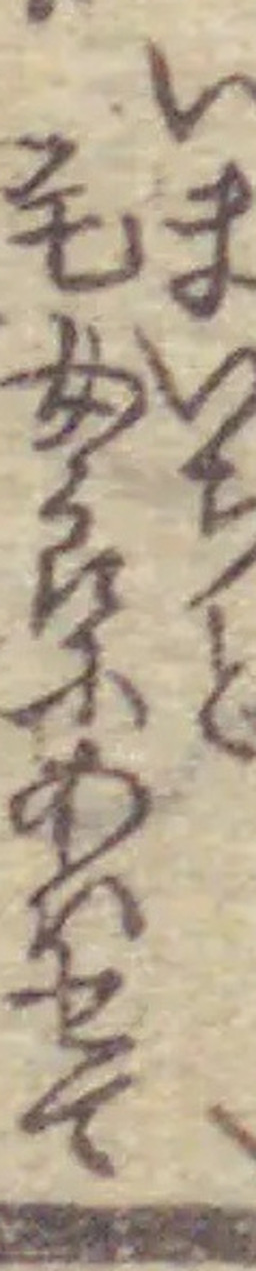毛女郎にあはせて
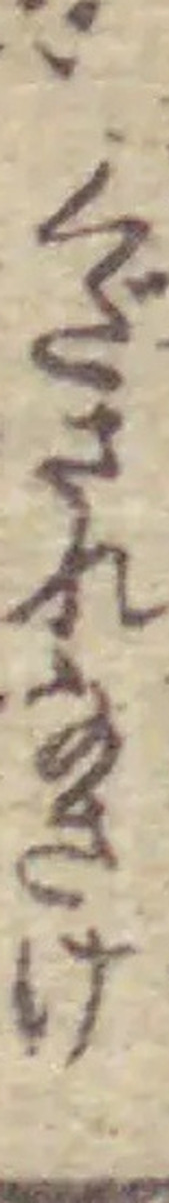くだされなさけ
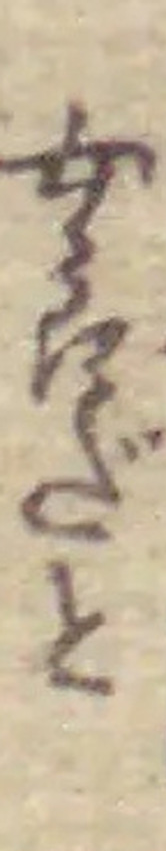女郎だと
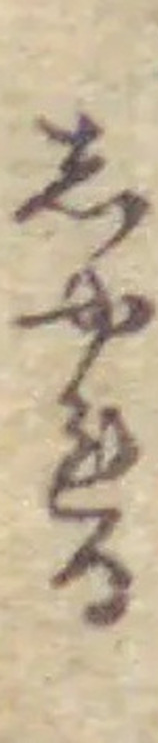しやれる

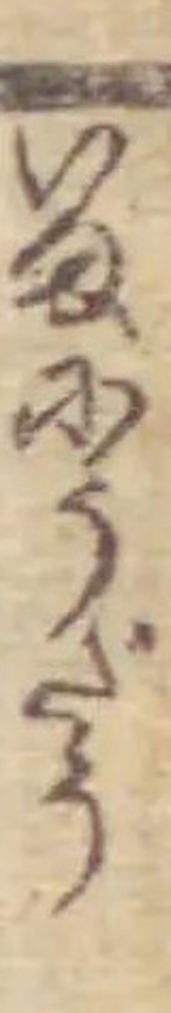いまにうだう
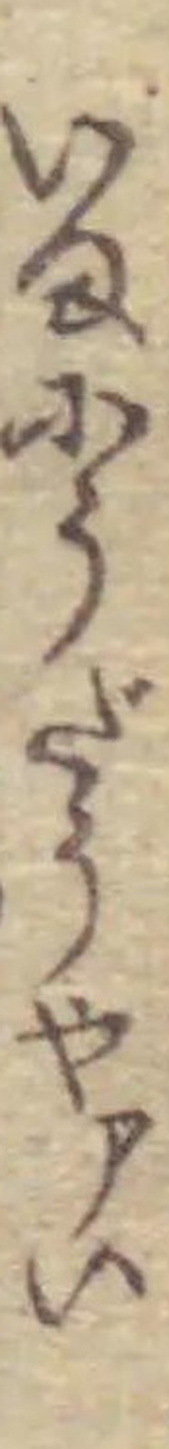いまにうだうやァい
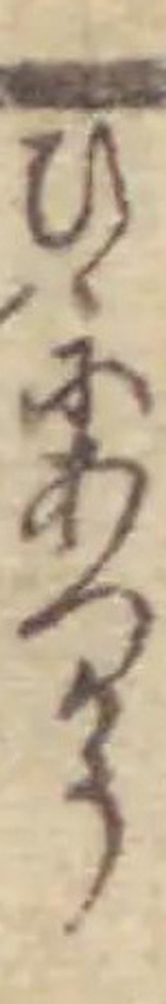ひゝにあつかう
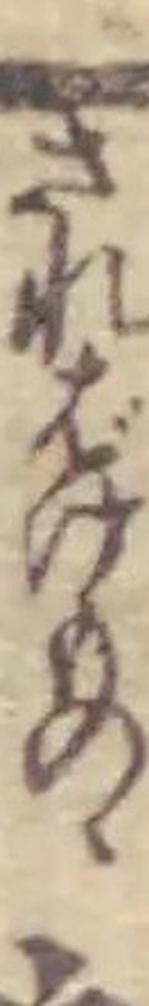さればけものゝ
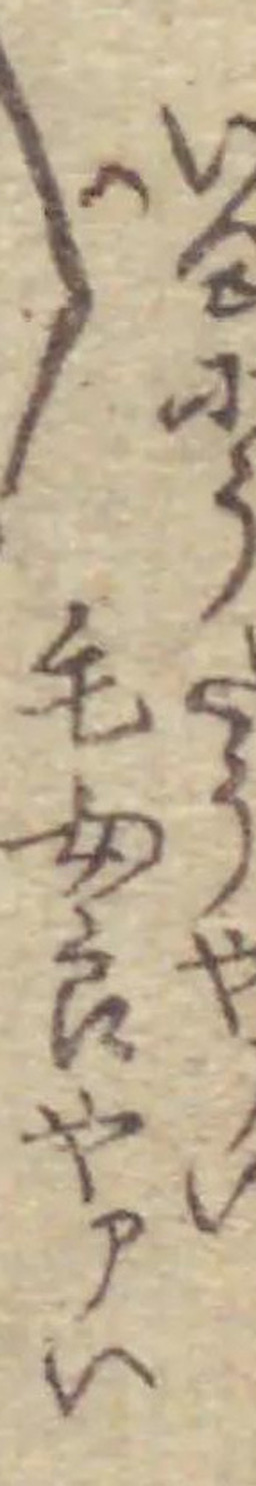毛女郎やァい
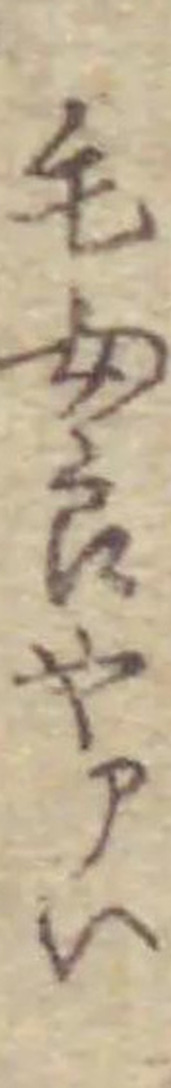毛女郎やァい
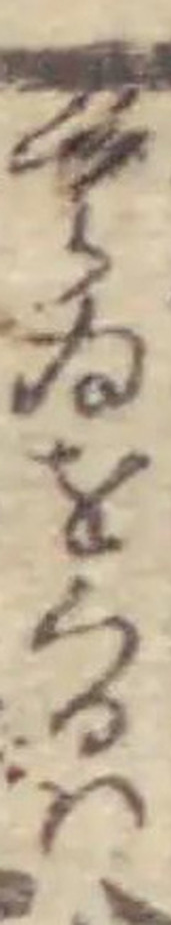くらゐをくるは
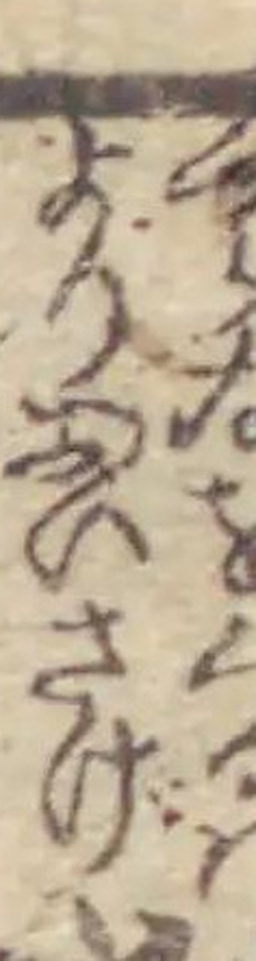よりおいさげ
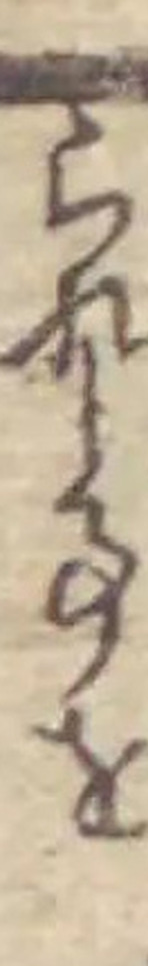られし事を
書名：大昔化物双紙 2巻
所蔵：国立国会図書館 National Diet Library, JAPAN
